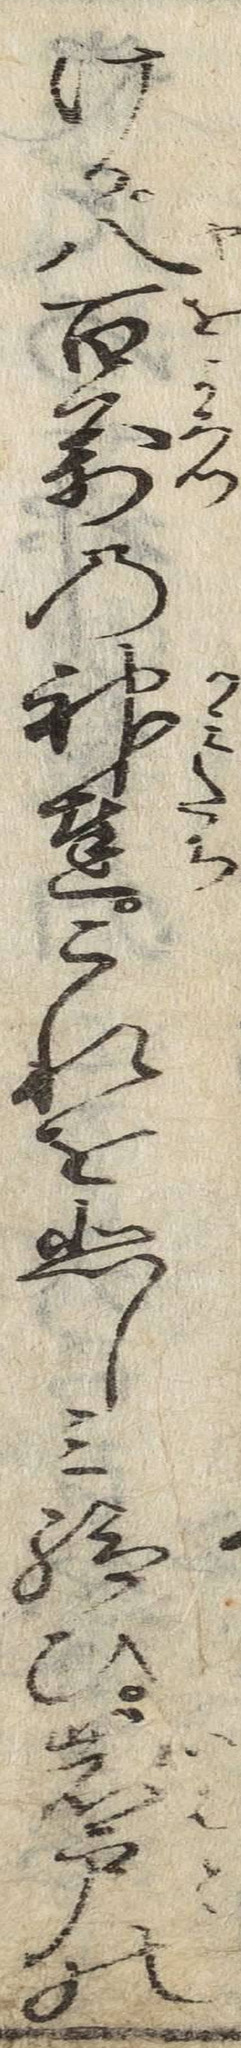ける。八百万の神達これを悲しみ給ひ。岩戸の
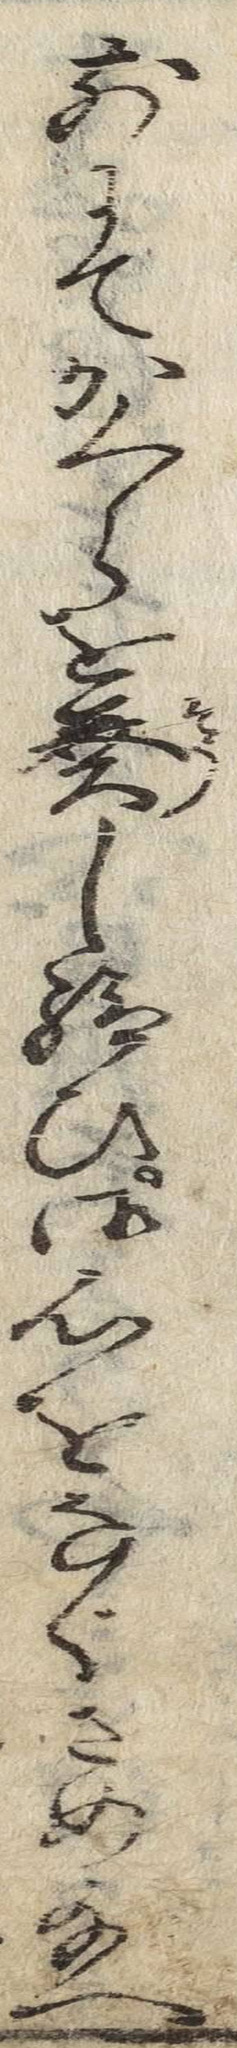前にてかくらを奏し給ひ。御心をなぐさめ給へ
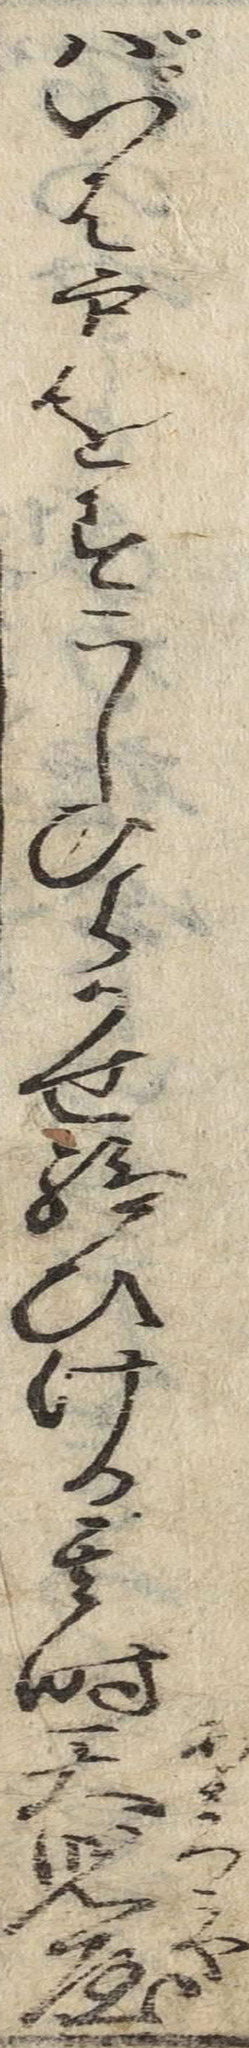ば。いは戸をすこしひらかせ給ひける。其時天児屋

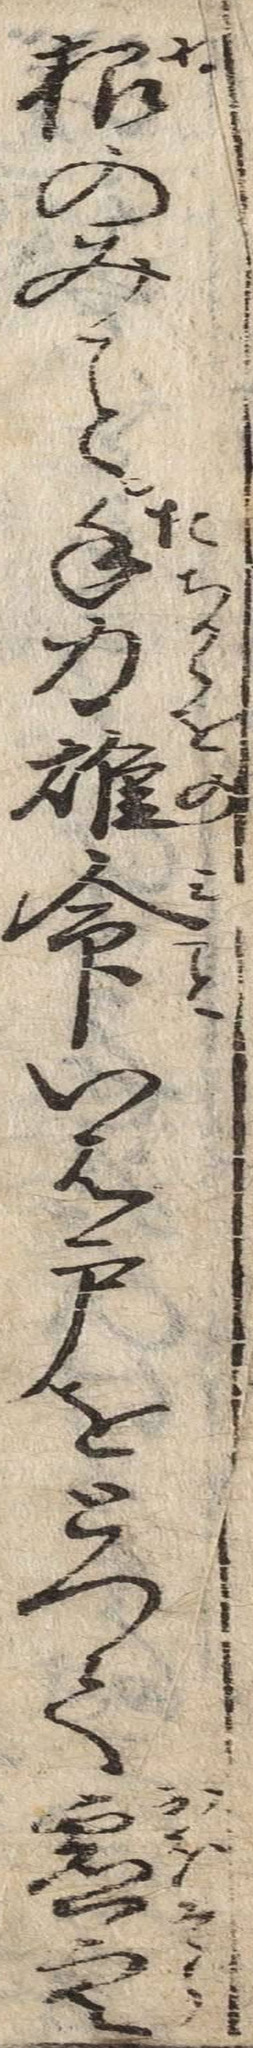根のみこと。手力雄命いは戸をとつて虚空
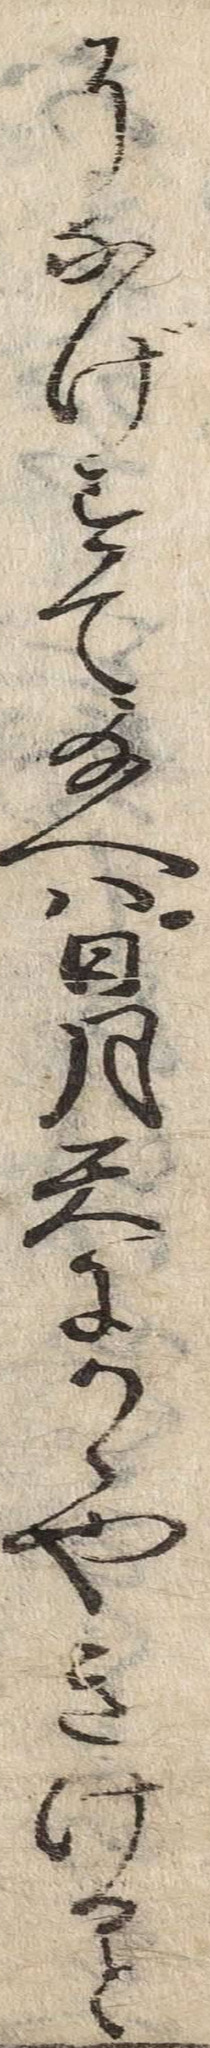になげすて給へは。日月天にかゝやきけると
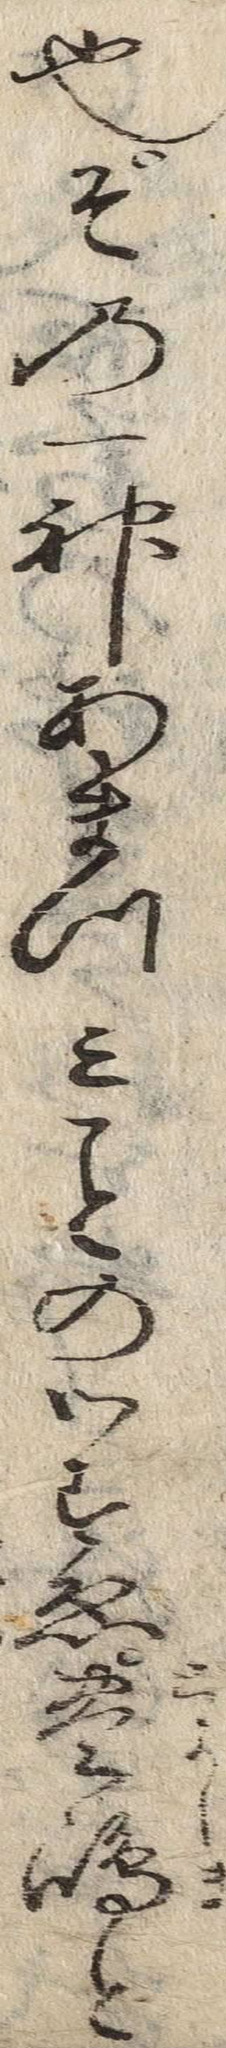也。その一神あまつみことの御すゑ。豊嶋と
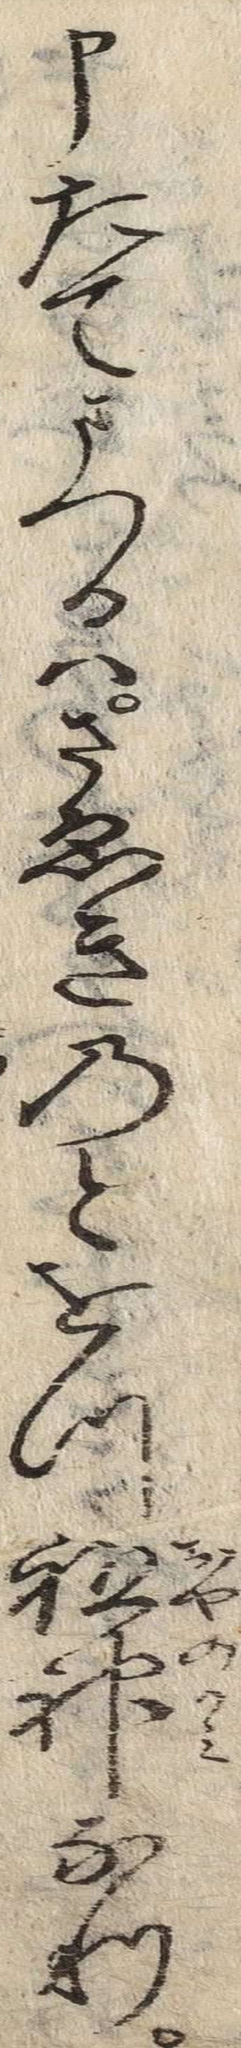申たてまつるは。さゑきのとをつ祖神なり。
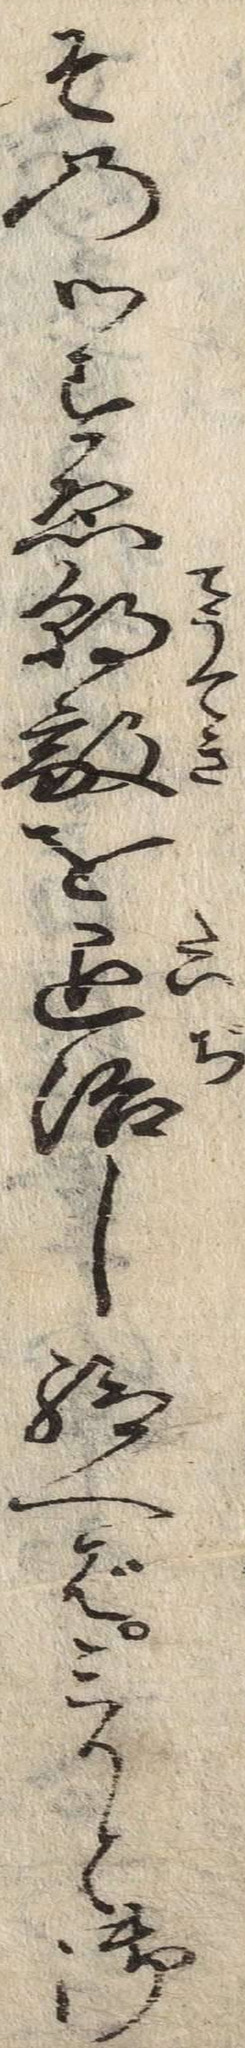その御すゑ朝敵を退治し給へば。みかと御
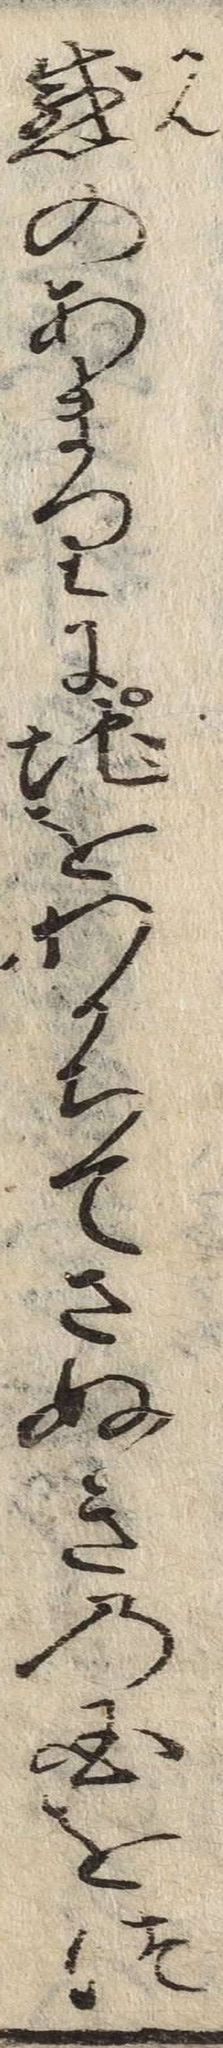感のあまりに。地をわかちてさぬきの国をつ
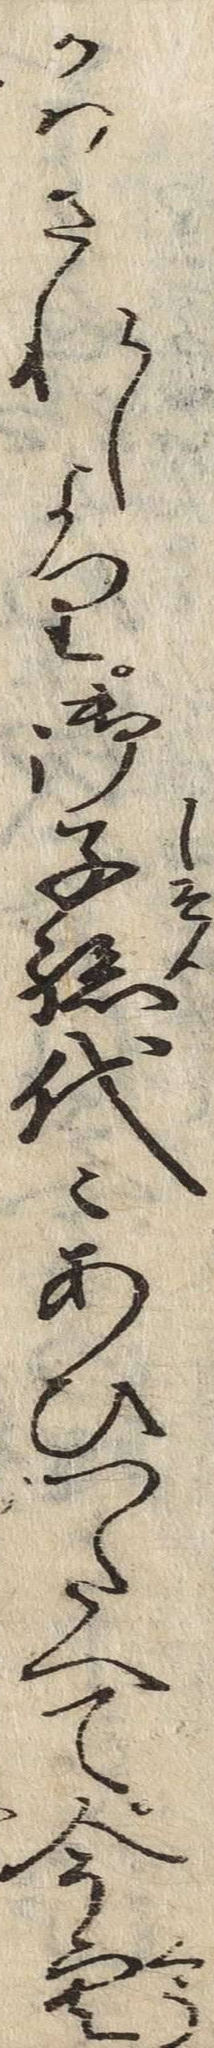かわされしより。御子孫代々あひつたへて今空
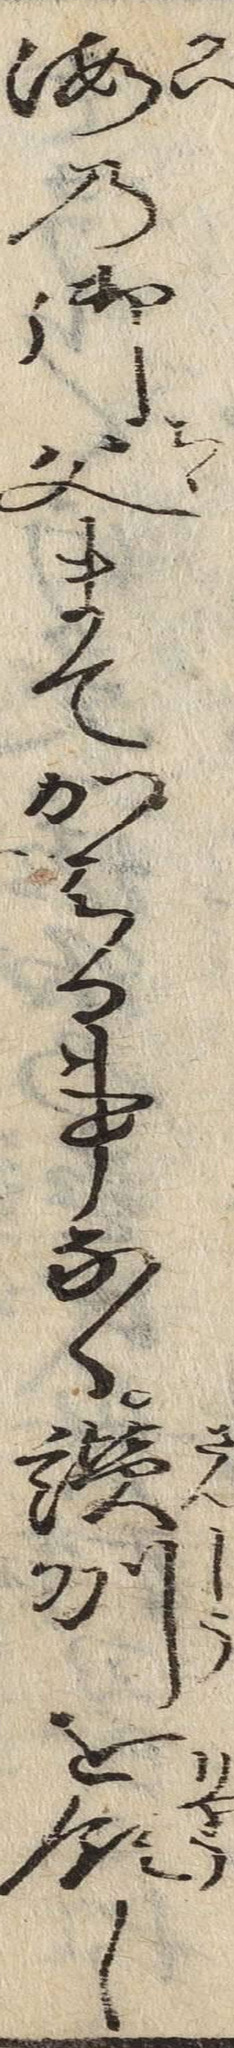海の御父まてかはる事なく。讃州を領し
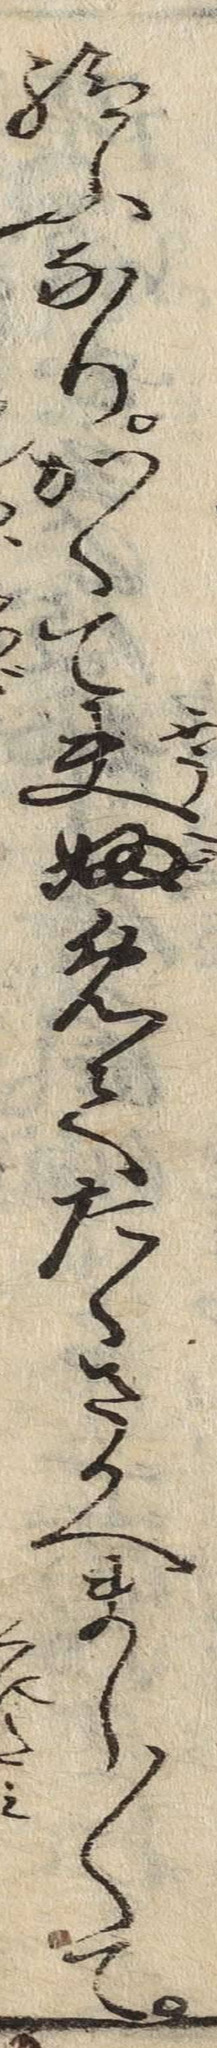給ふなり。かくて夫婦めてたくさかへまし〳〵て。
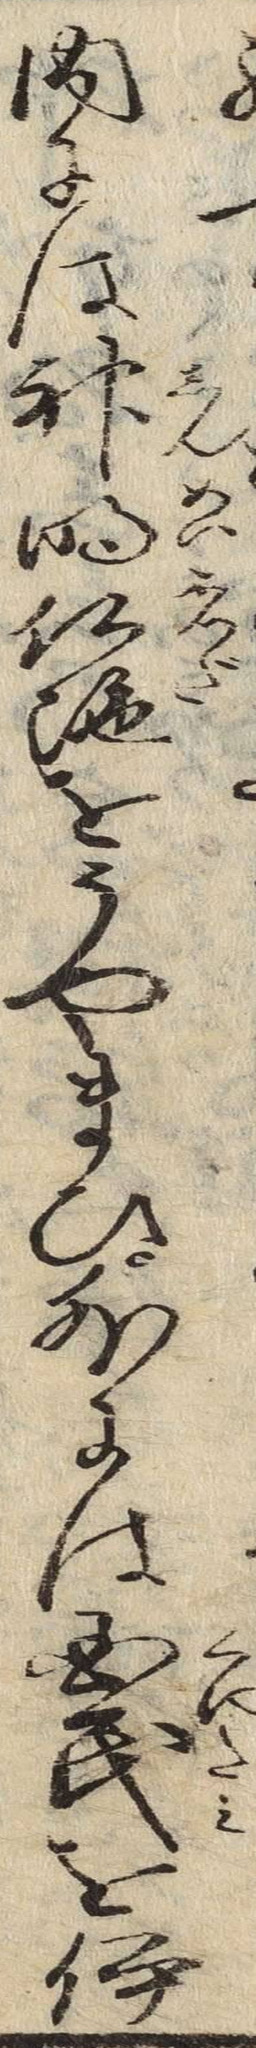内には神明仏陀をうやまひ。外には国民をい
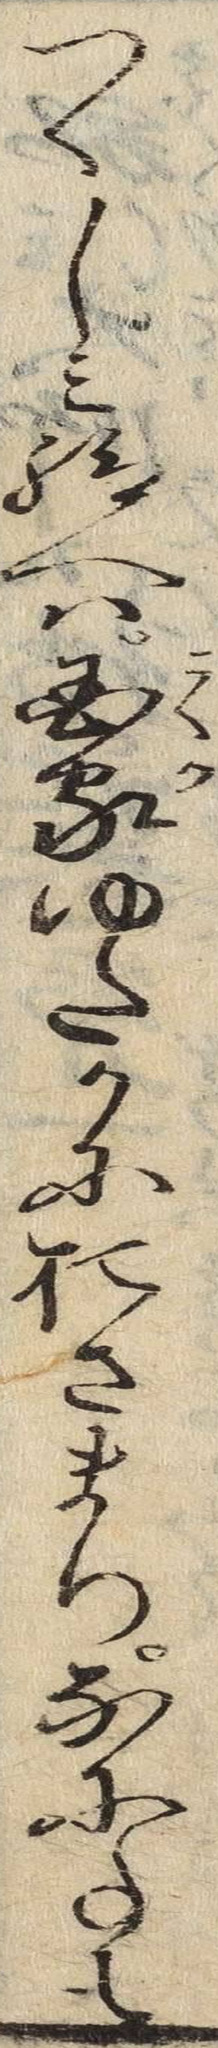つくしみ給へは。国家ゆたかにおさまり。なに事も
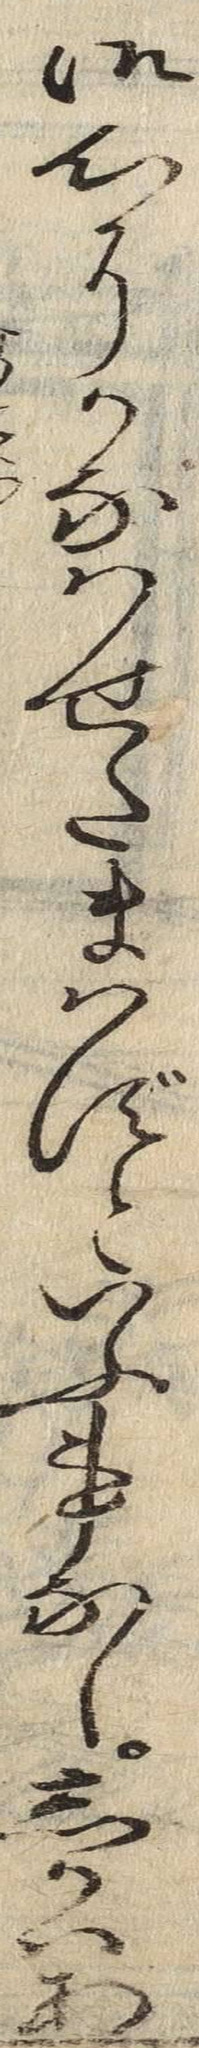御心にかなはせたまはずといふ事なし。しかはあ
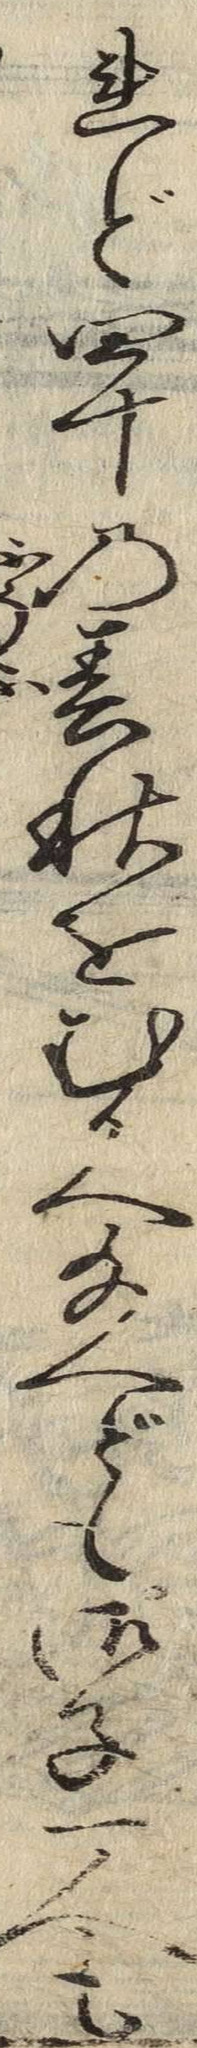れど四十の春秋をむかへ給へども。御子一人も
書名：弘法大師御傳記
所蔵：京都府立京都学・歴彩館 国文学研究資料館
